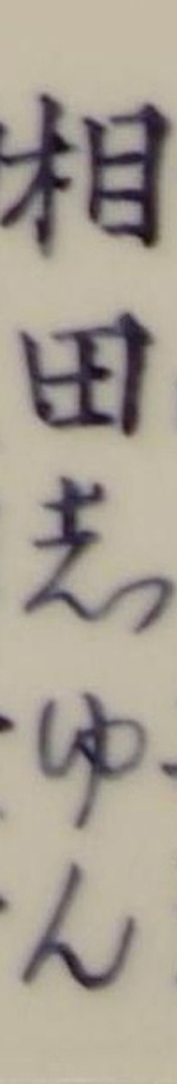相田しゆん
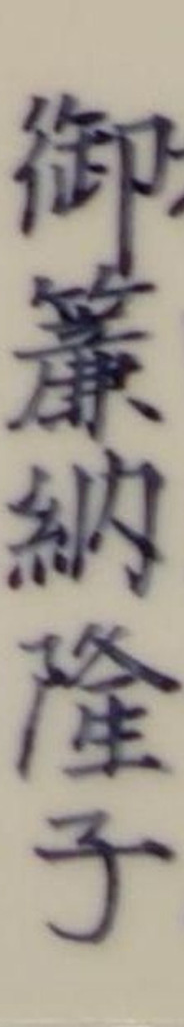御簾納隆子
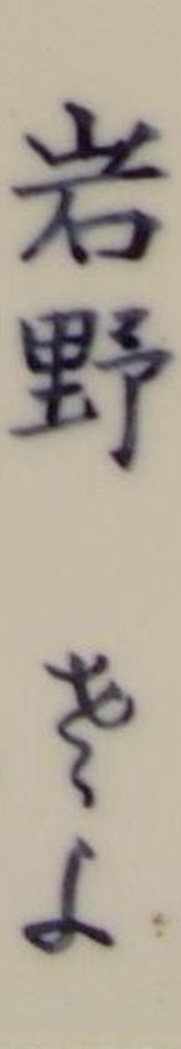岩野さよ
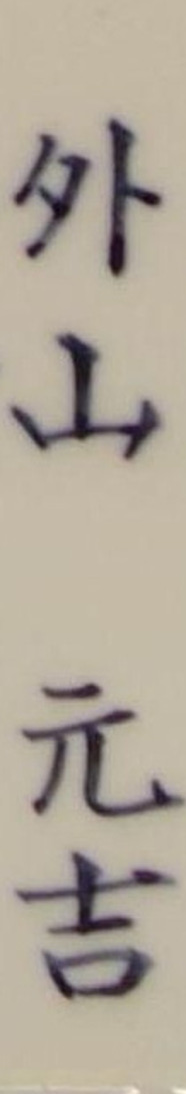外山元吉
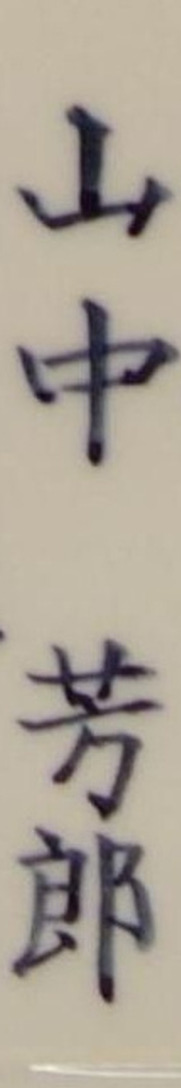山中芳郎
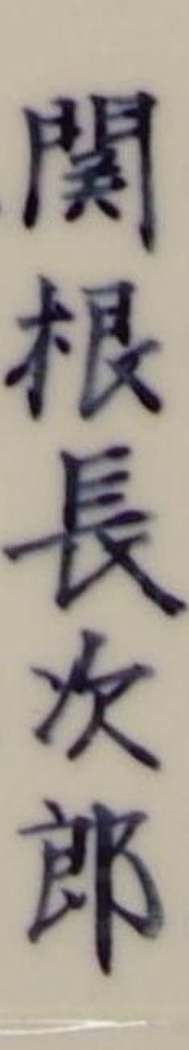関根長次郎
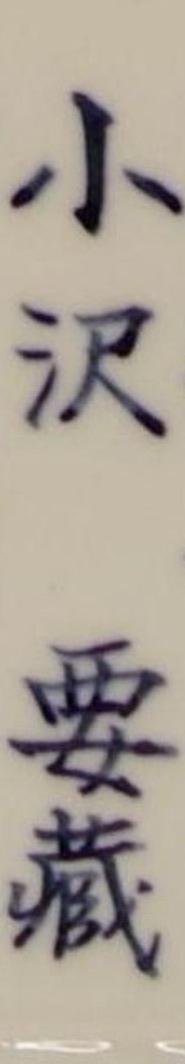小沢要蔵
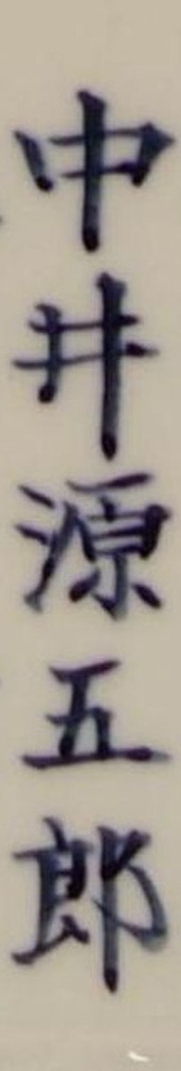中井源五郎
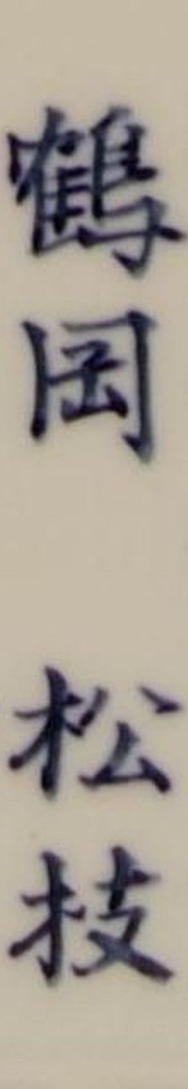鶴岡松枝
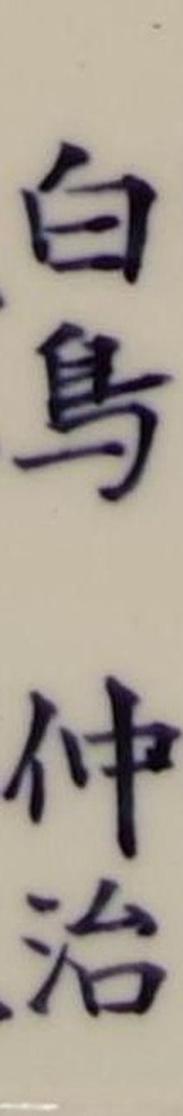白鳥仲治
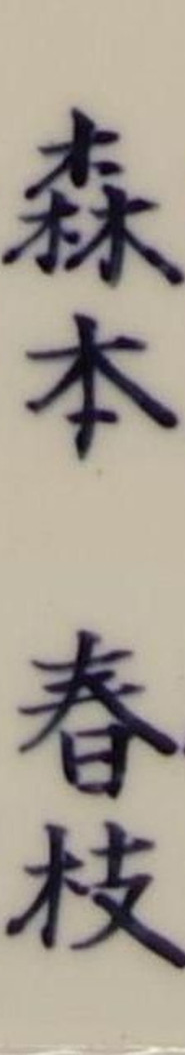森本春枝
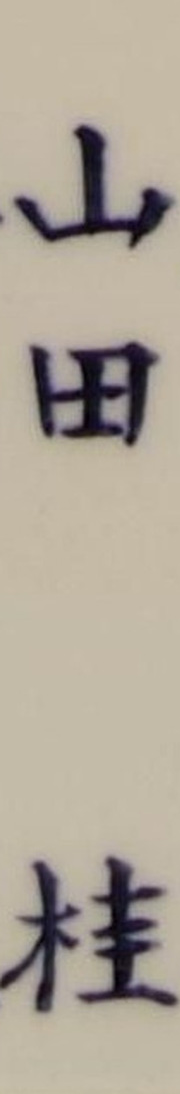山田桂
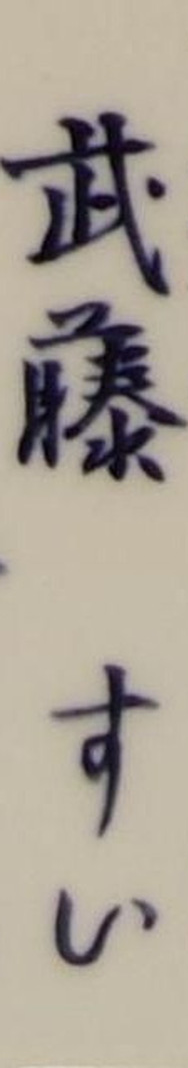武藤すい
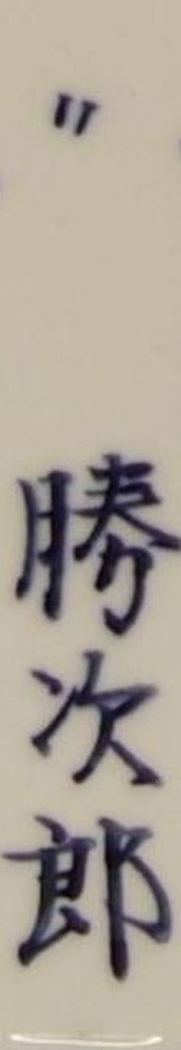勝次郎
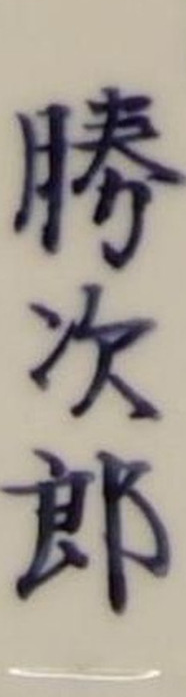勝次郎
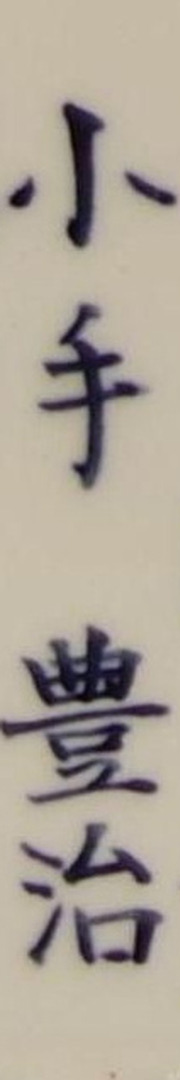小手豊治
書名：E~L
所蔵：高野山金剛峯寺
